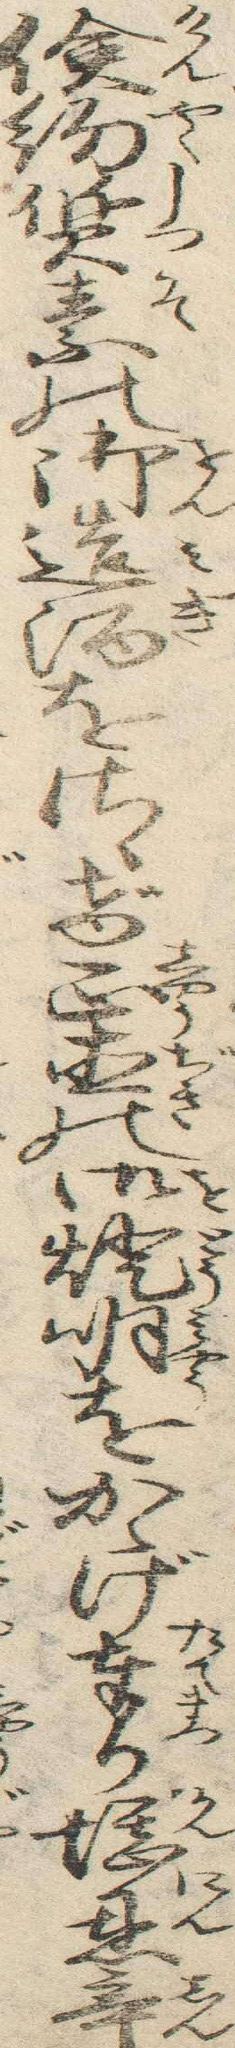倹約質素の御造酒をさゝげ正直の御燈明をかゝげ奉り堪忍辛
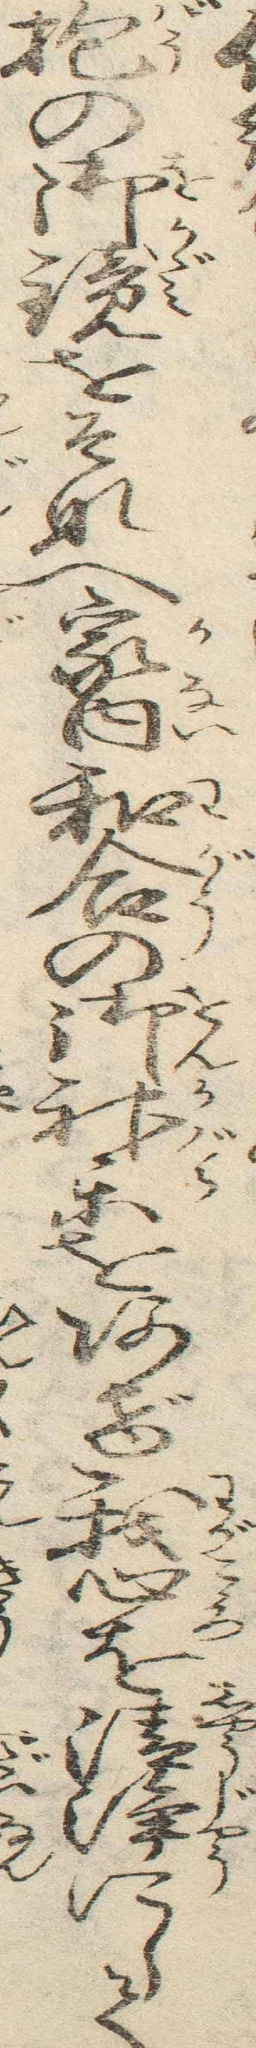抱の御鏡をそなへ家内和合の御神楽をあげ我心を清浄にして
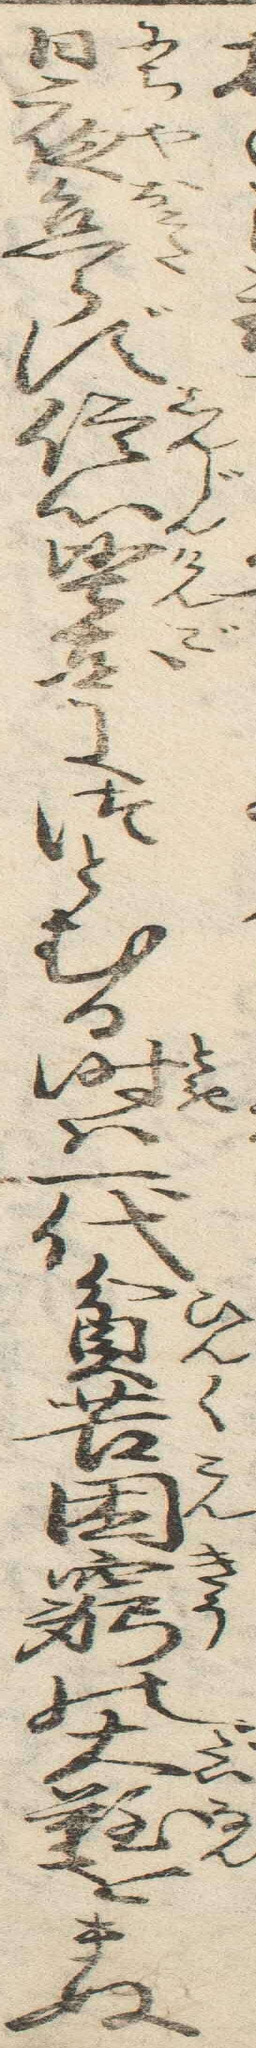日夜怠らず信心堅固につとむる時は一代貧苦困窮の大難をまぬ
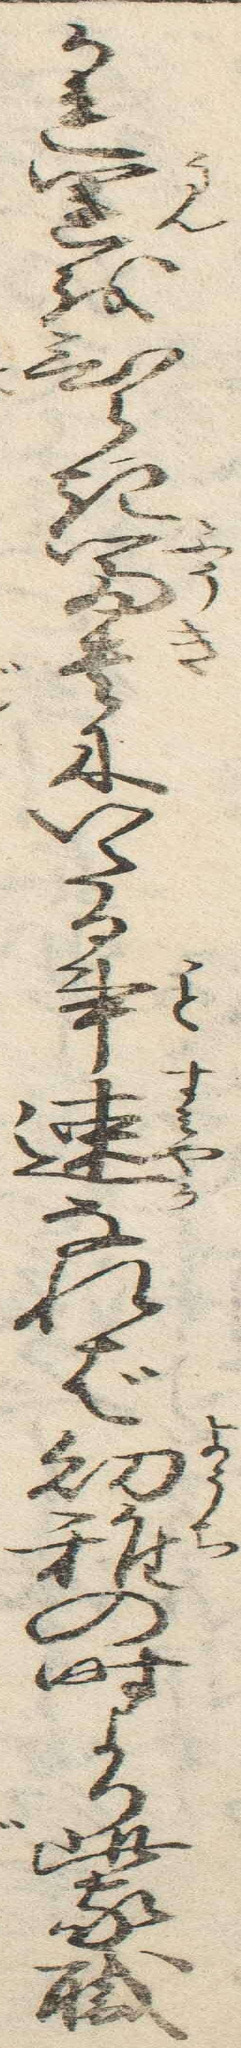かれ運をひらき富貴にいたる事速なれば幼稚の時より此家職
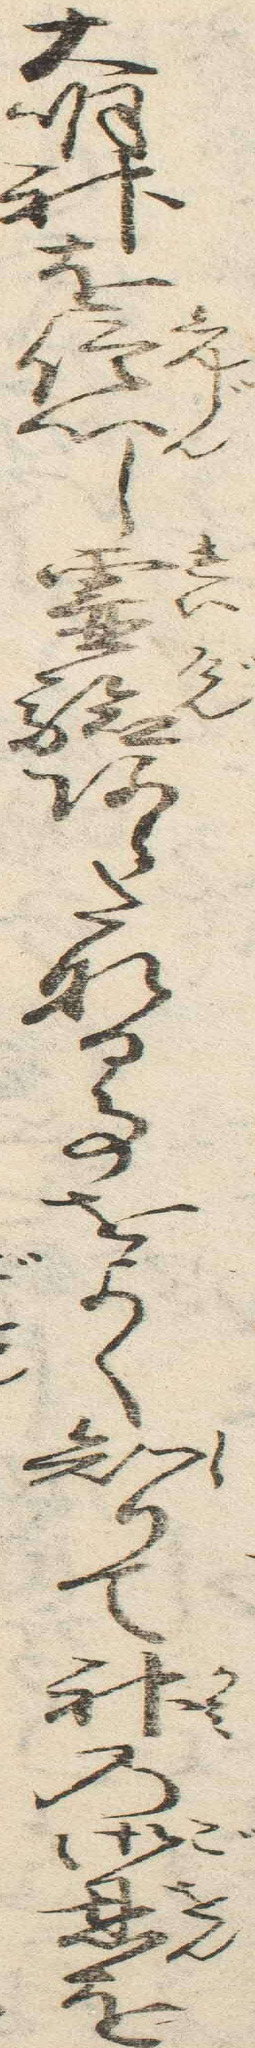大明神を信心し霊験あらたなる事をよく知りて神の御恩を
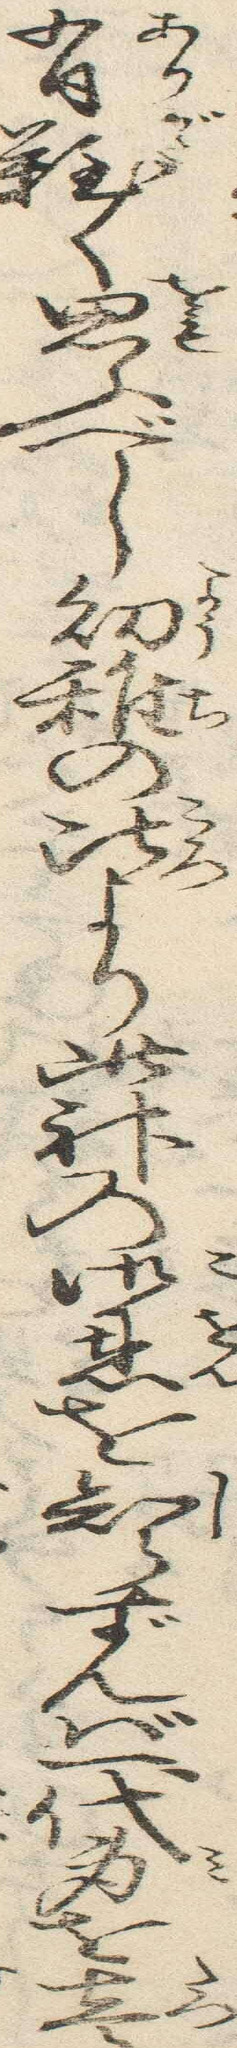有難く思ふべし幼稚の比より此神の御恩を知らずんば一代身を立る
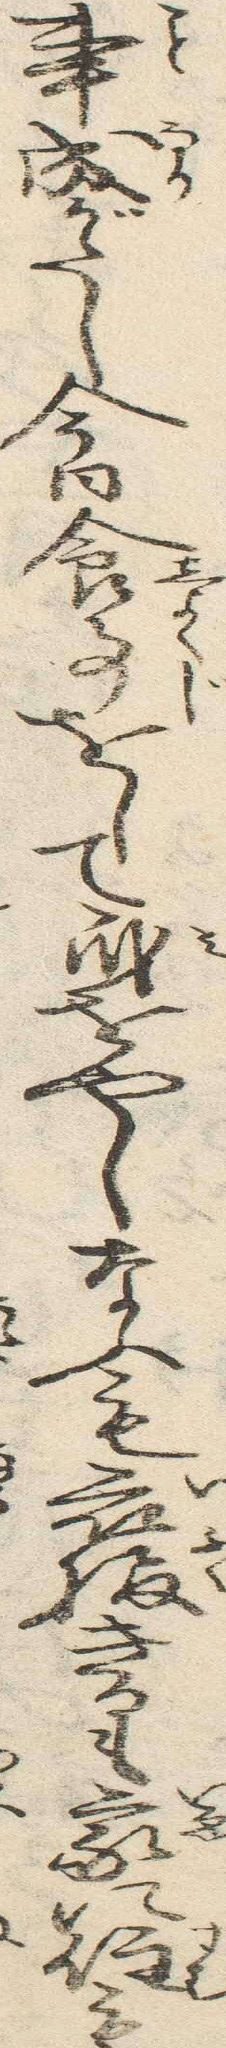事成がたし今日食事をして身をやしなふも衣服きるも家にて住も
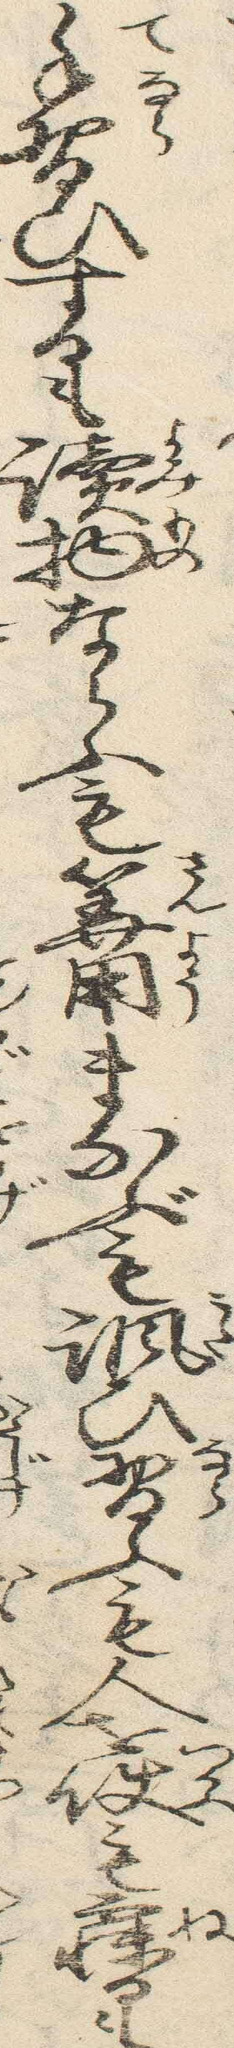手習ひするも読物ならふも算用まなぶも諷ひ習ふも人を使も寝るも
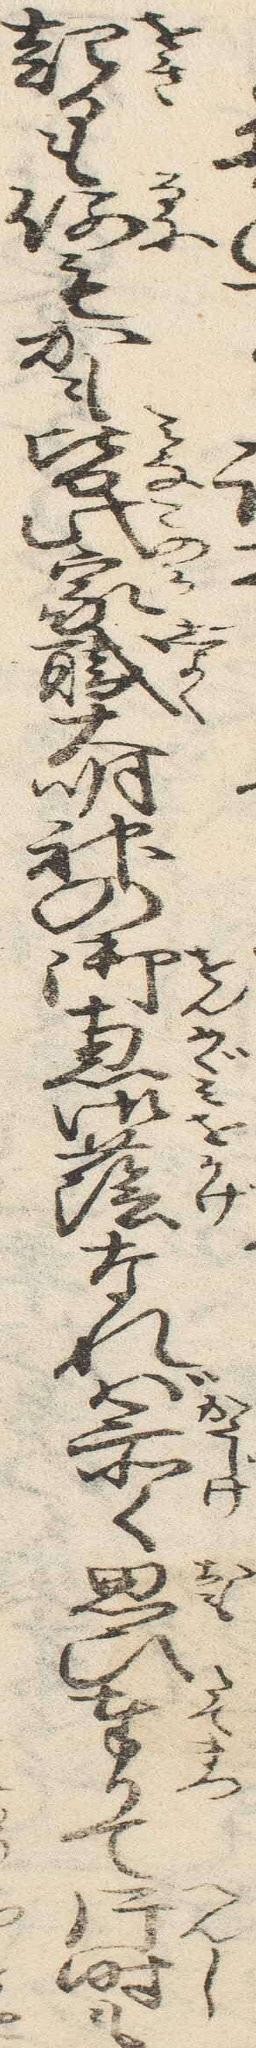起るも何もかも皆此家職大明神の御恵御蔭なれば忝く思ひ奉りて片時も
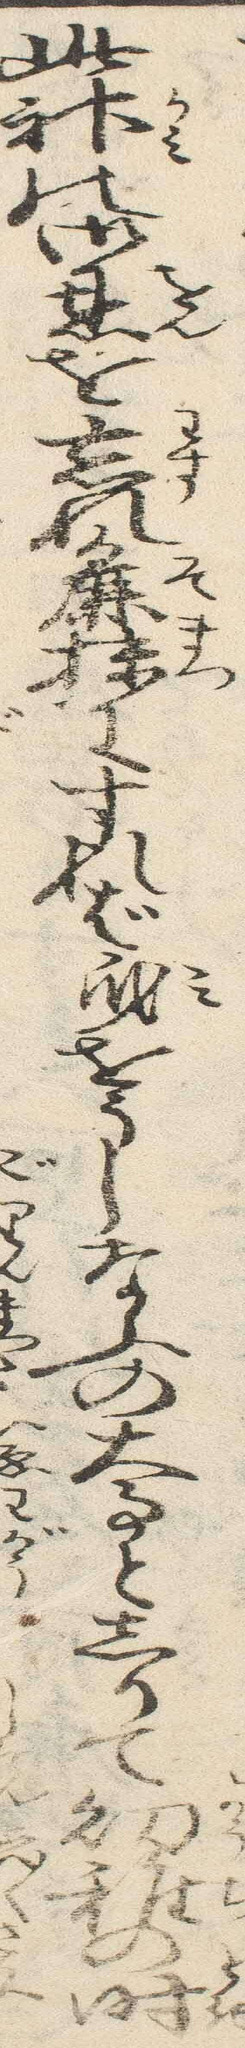此神の御恩を忘れ麁抹にすれば身をうしなふの大事としりて幼稚の時
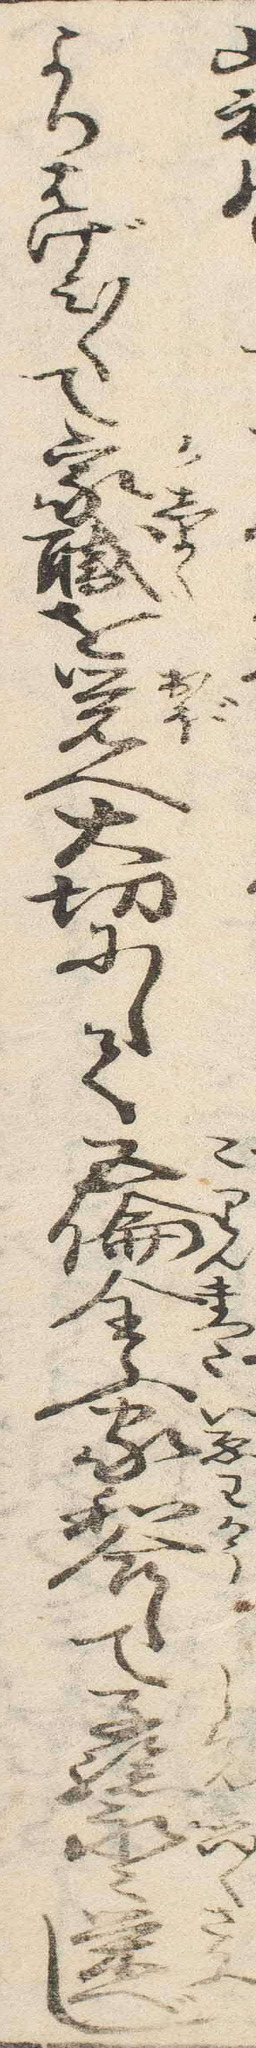よりはげみ〳〵て家職を覚へ大切にして五倫全ふ家和合して子孫永々栄べし
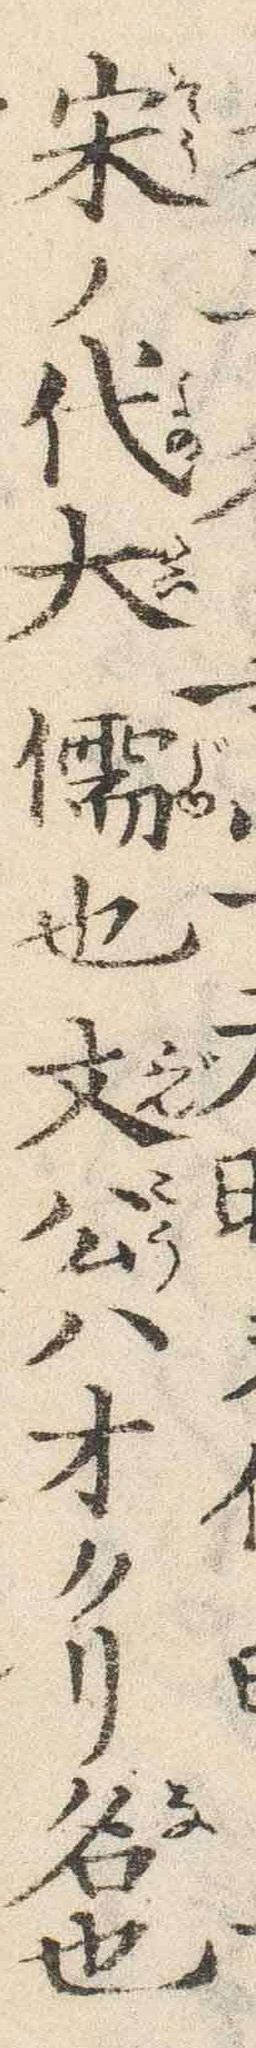宋ノ代大儒也文公ハオクリ名也
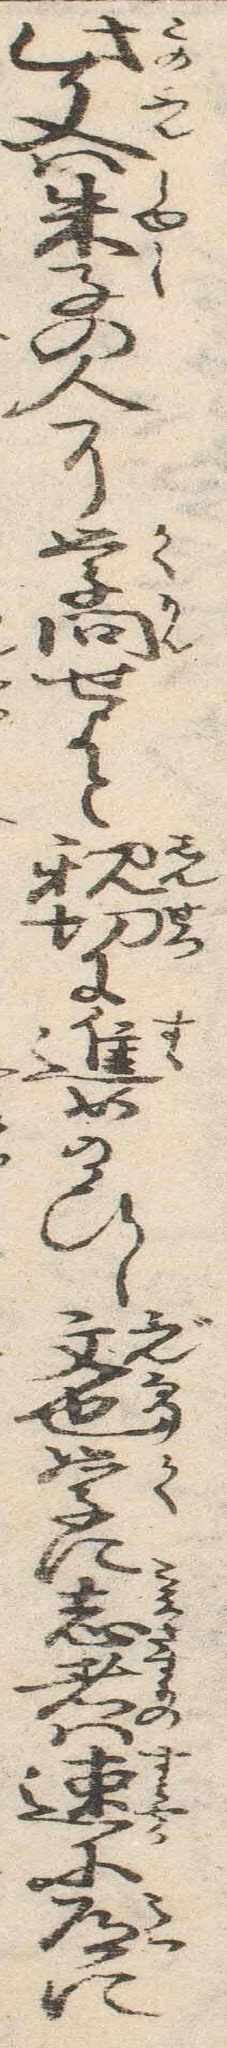此文は朱子の人に学問せよと親切に進め給ひし文也学に志者は速に道に
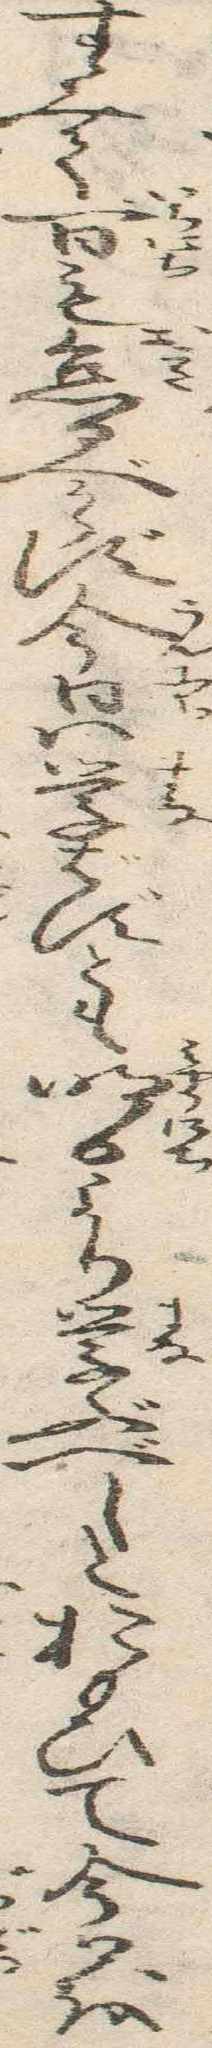すゝみて一日も怠るべからず今日は学ばずとも明日より学ぶべしとおもひて今日を
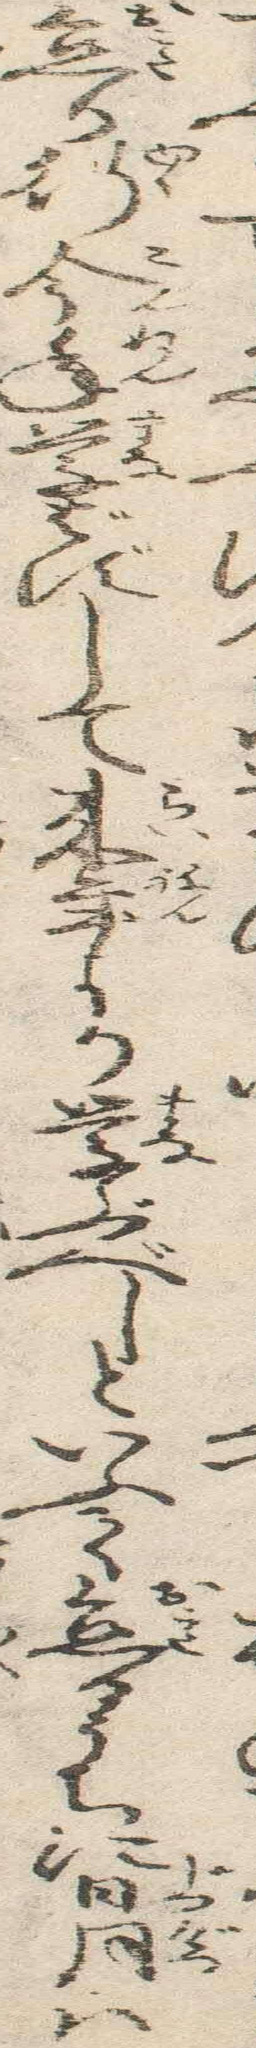怠り行今年学ばずして来年より学ぶべしといふて怠るうちに日月は
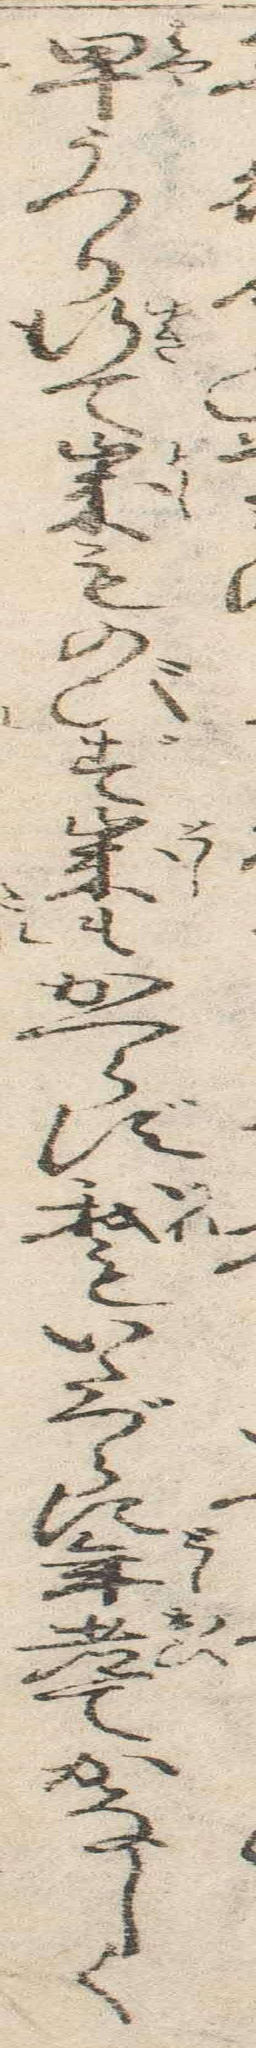早うつり行て歳ものびず歳もかへらず我もいたづらに年老てかなしく
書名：撫育草
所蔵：東京学芸大学附属図書館 国文学研究資料館
